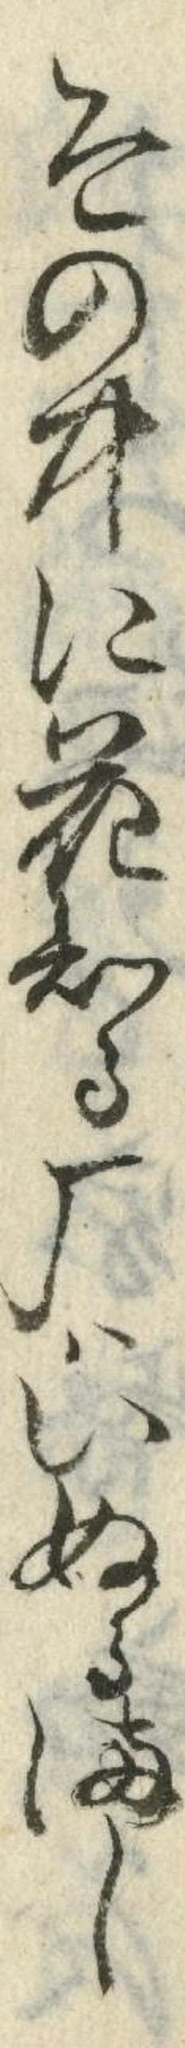その中に花知る雁はいぬるまし
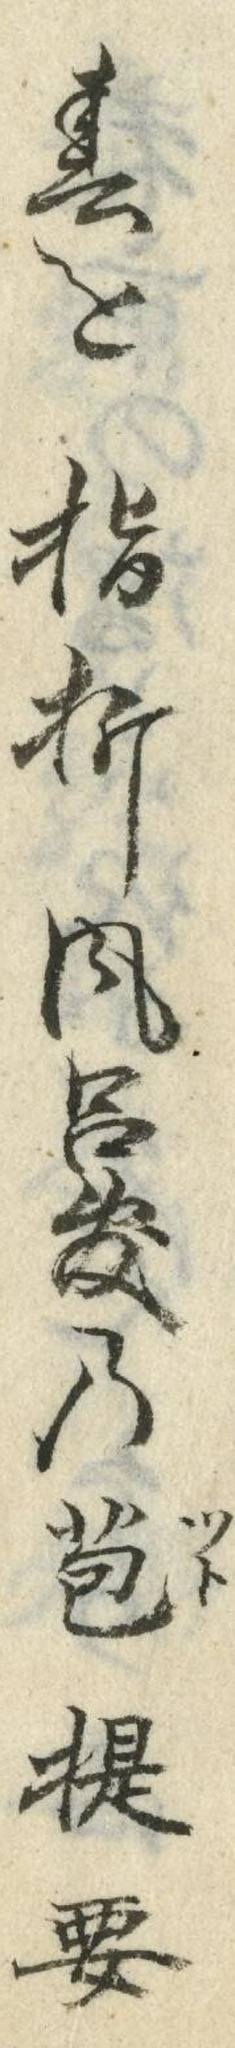春を指折風呂敷の苞提要
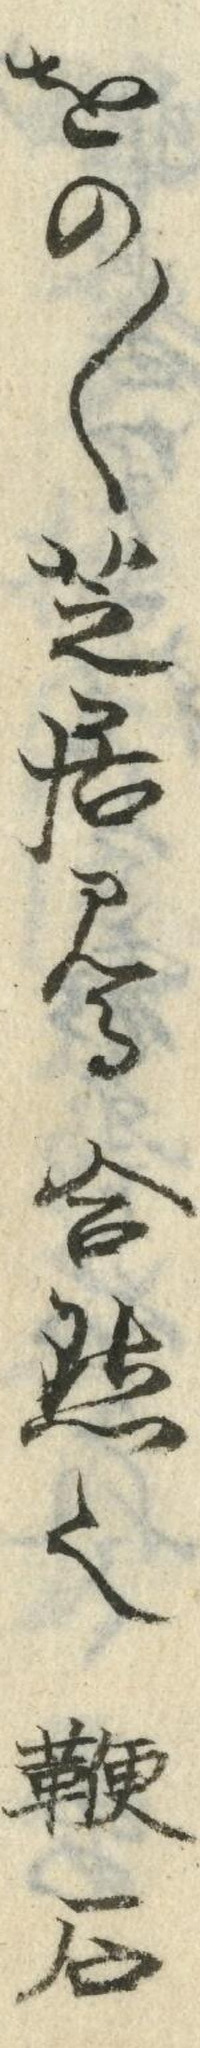をの〳〵芝居見る合点也鞭石
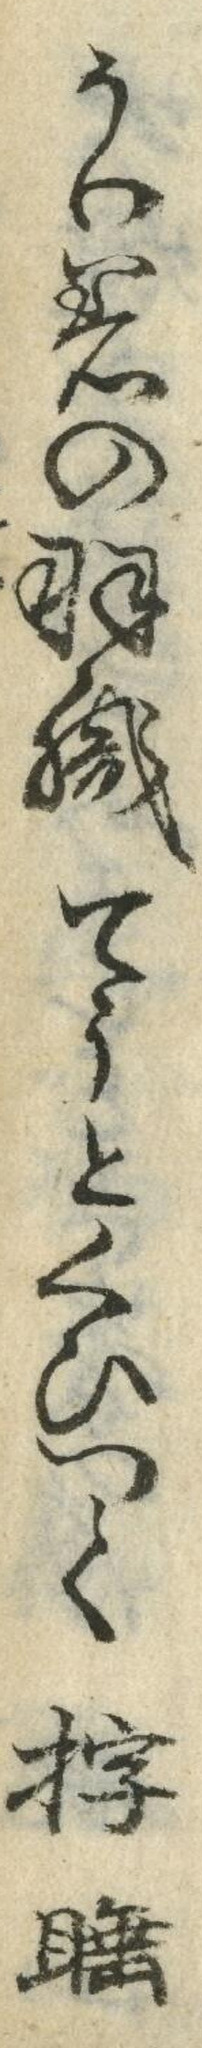うは着の羽織てうとくひつく桴睡

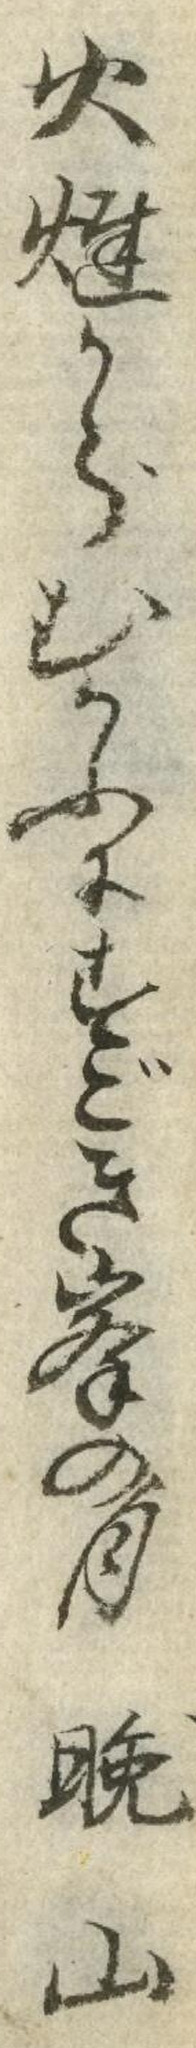火燧からむかふにすゞき峯の月晩山
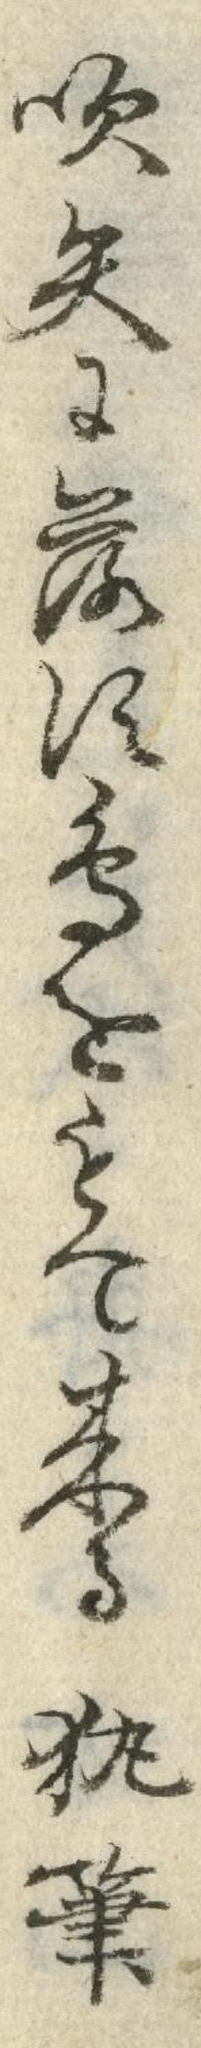吹矢に落す鳥をもて来る執筆
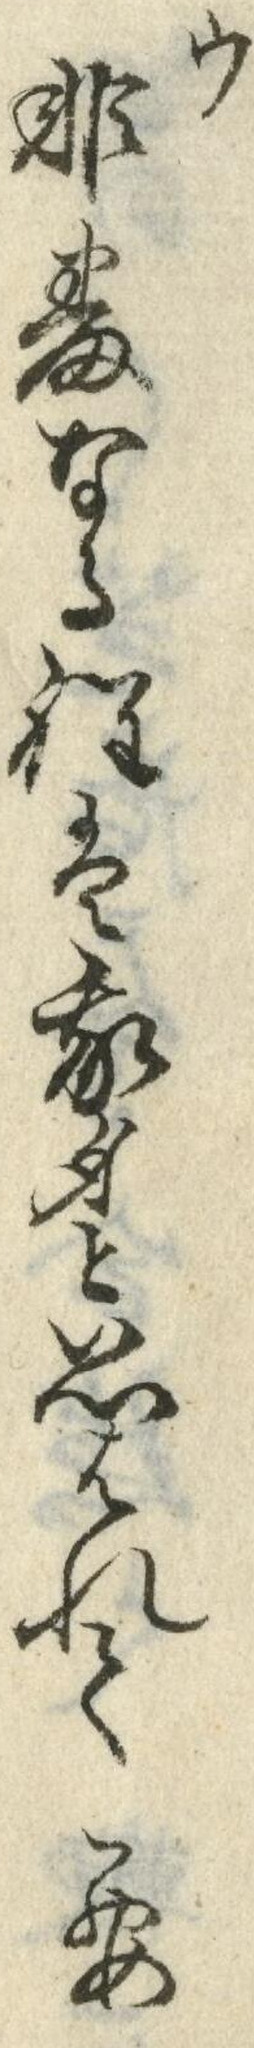非番なる程は我身と思はれて要
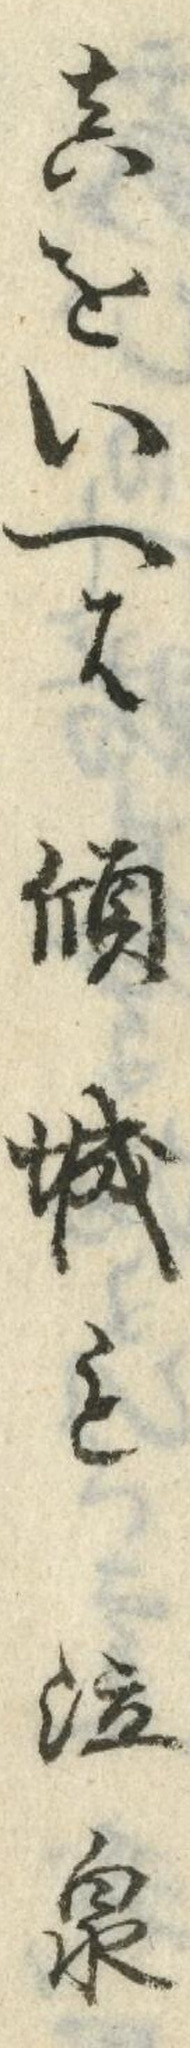真をいへは傾城も泣泉
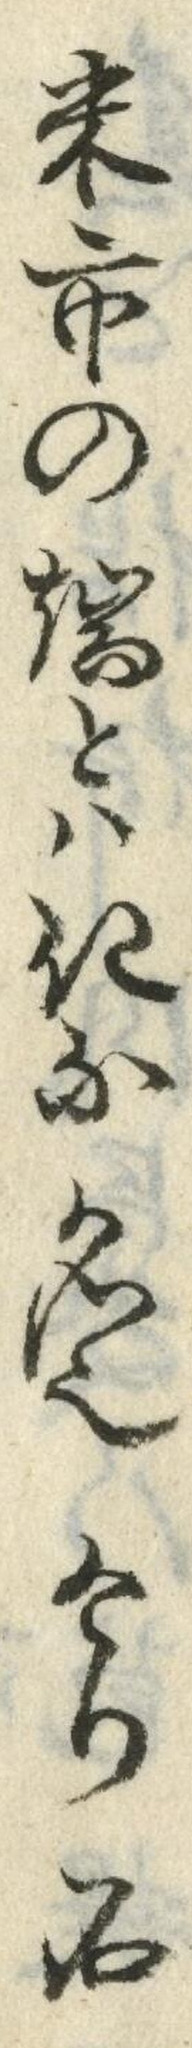米市の端とは仇な名也けり石
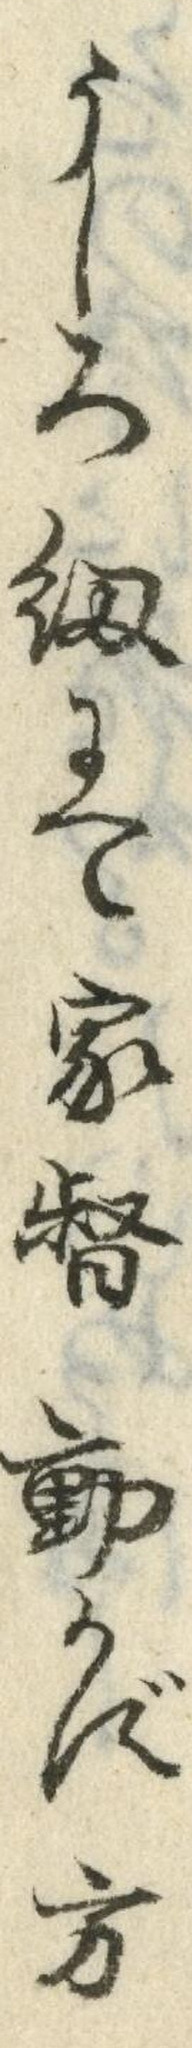うしろ紐にて家督動かず方
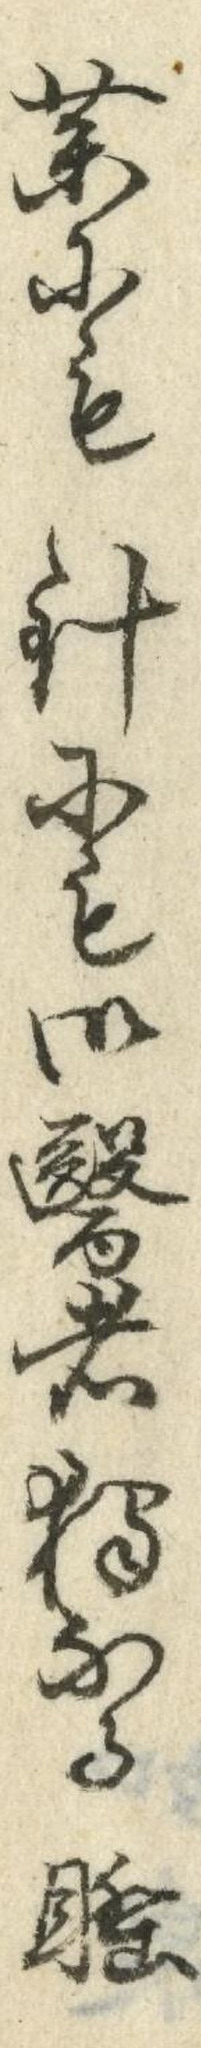薬にも針にも御医者独なる睡
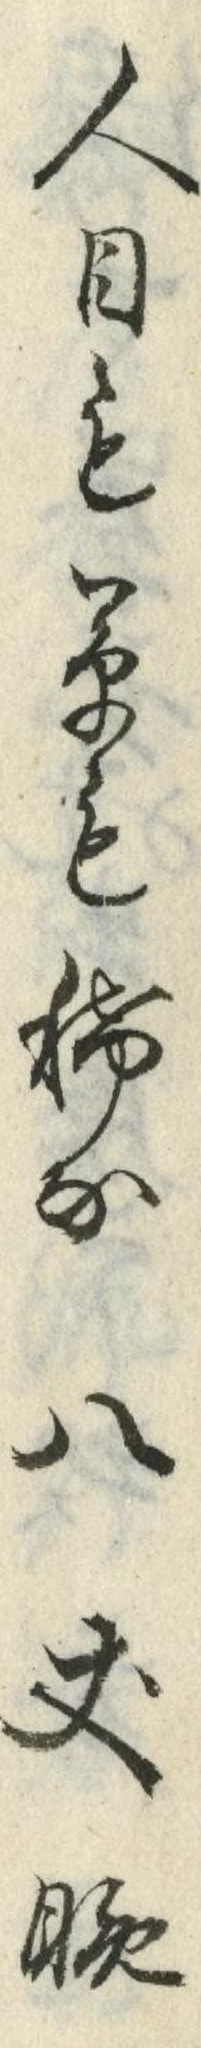人目も草も稀な八丈晩
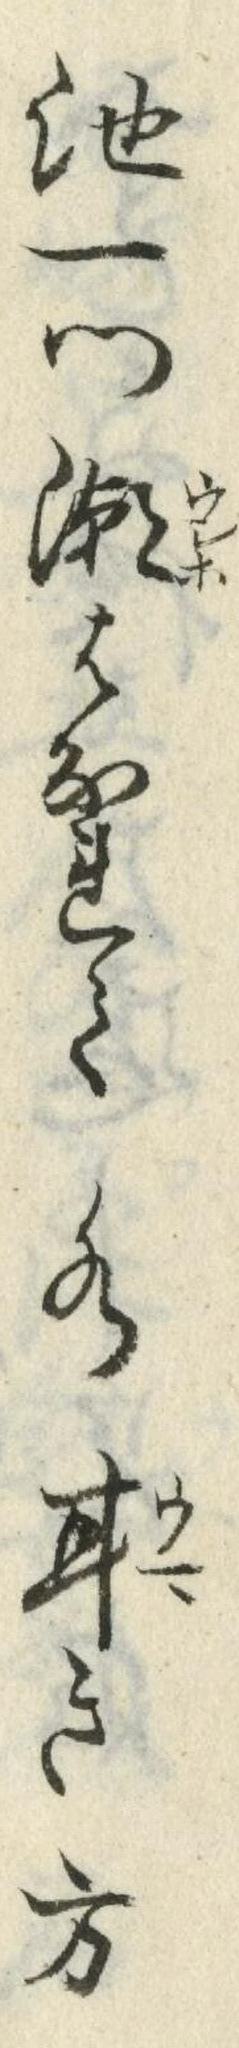池一つ潮はなれて水甘き方
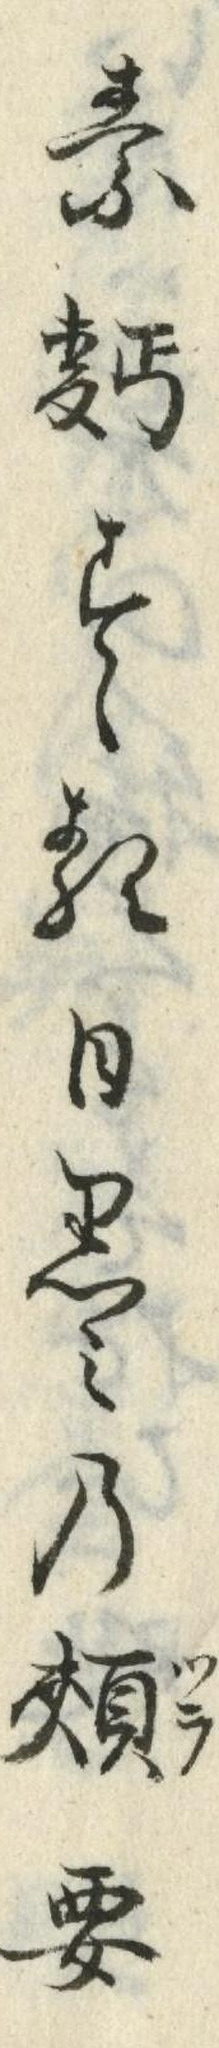素麺すゝる日黒ミの頬要
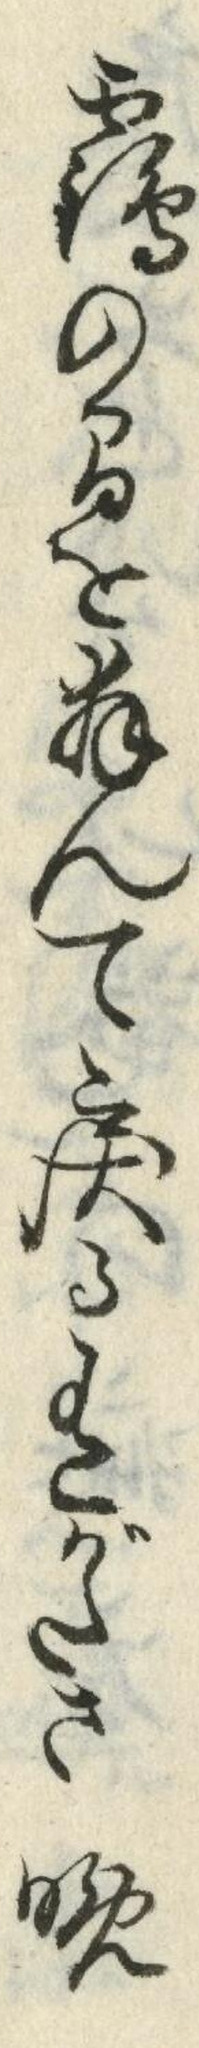鶴の間を拝んて戻る有がたさ晩
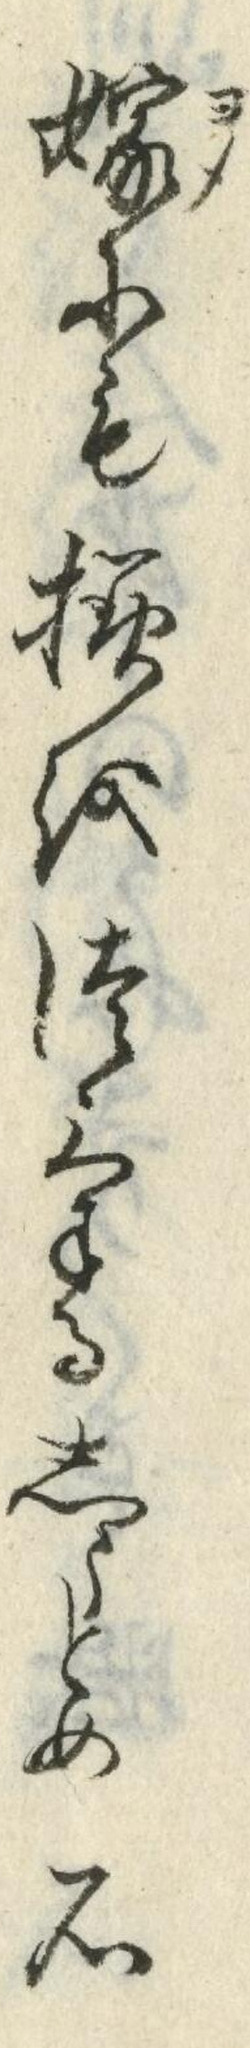嫁にも様をつけるしうとめ石
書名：誹諧　能登釜
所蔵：Ishikawa Prefectural Library
